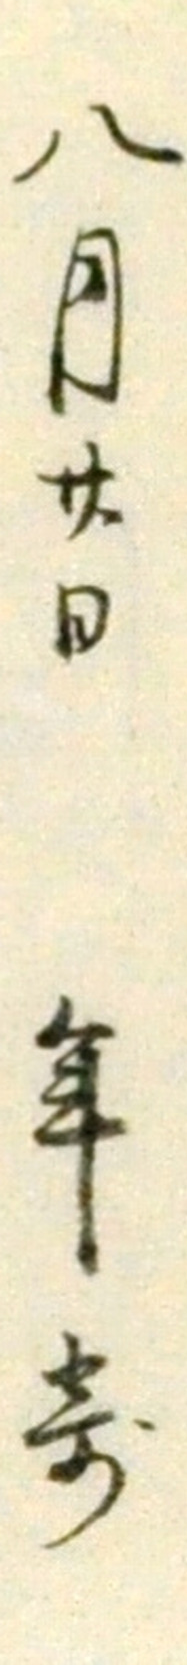八月廿日年寄
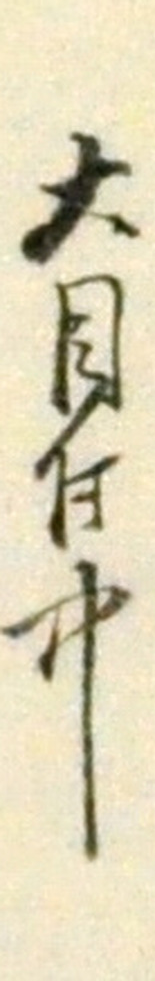大目付中

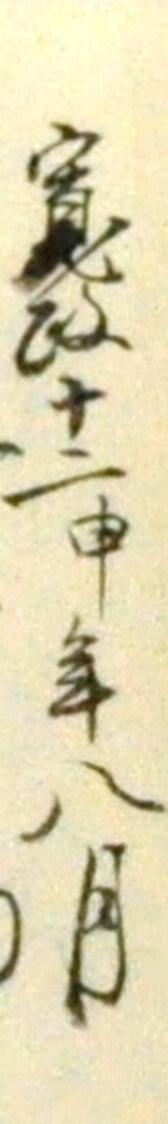寛政十二申年八月
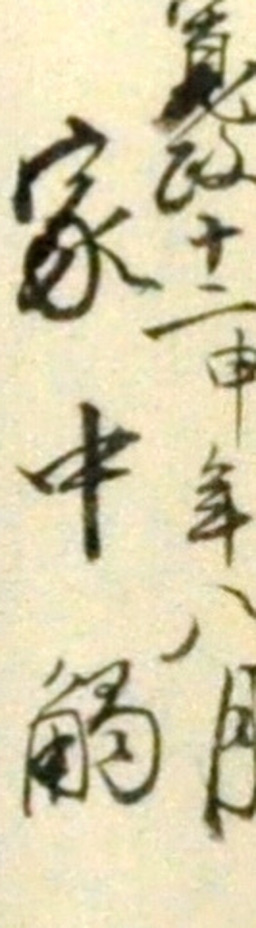家中触
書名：家中触
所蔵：伊那市立高遠町図書館・合同会社AMANE
